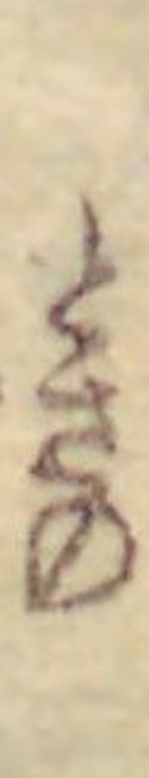とさの
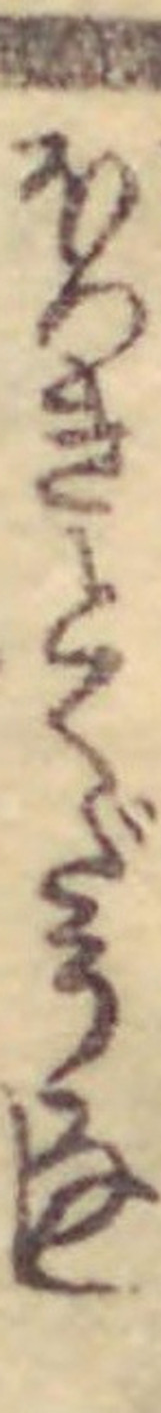ほつきとくだうなし
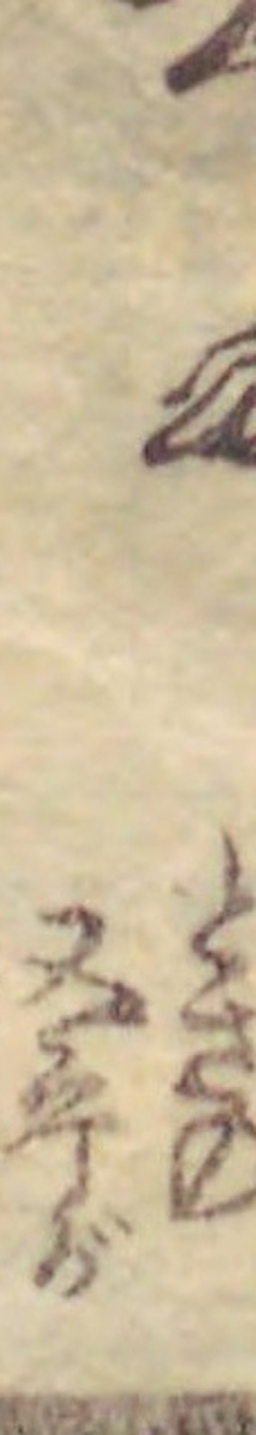又平が
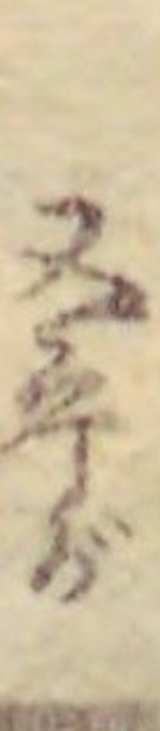又平が
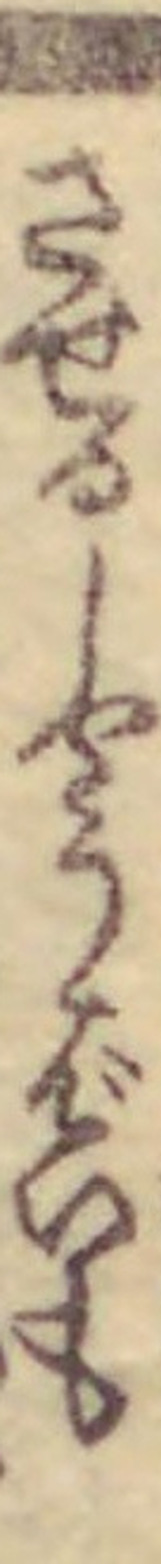させるしやうばいも
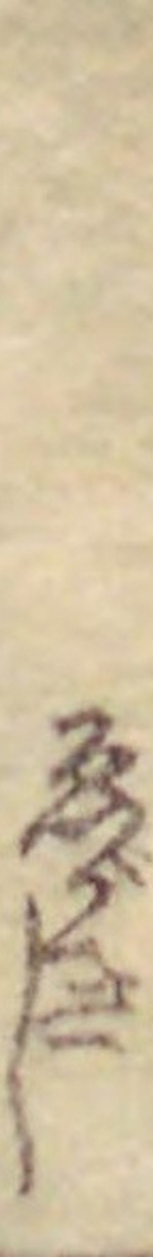ゑがきし
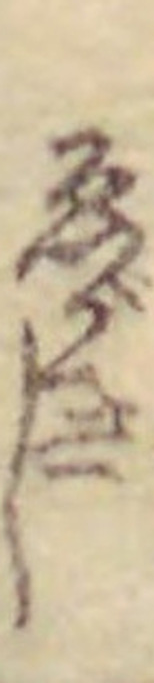ゑがきし
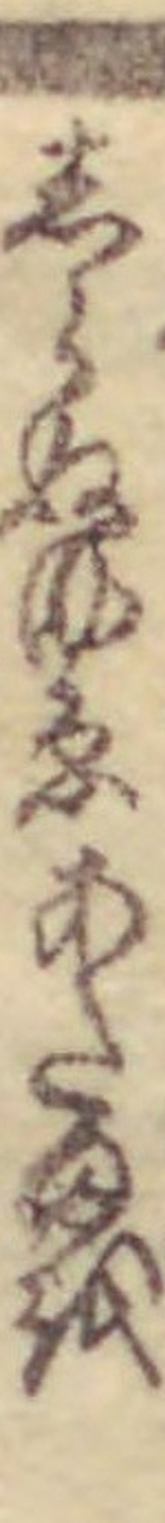しらぬゆゑあたまを
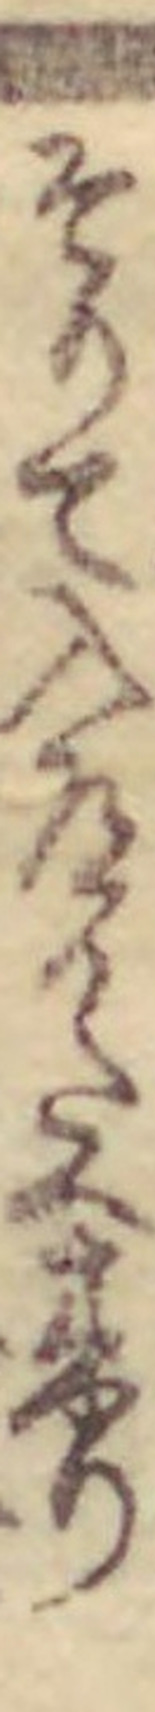そりて入道かたへ来り
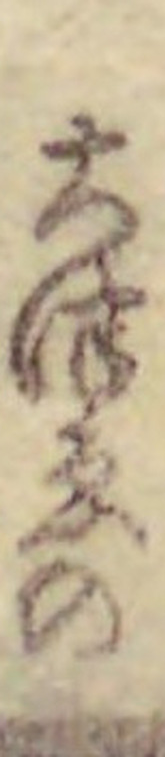大つゑの
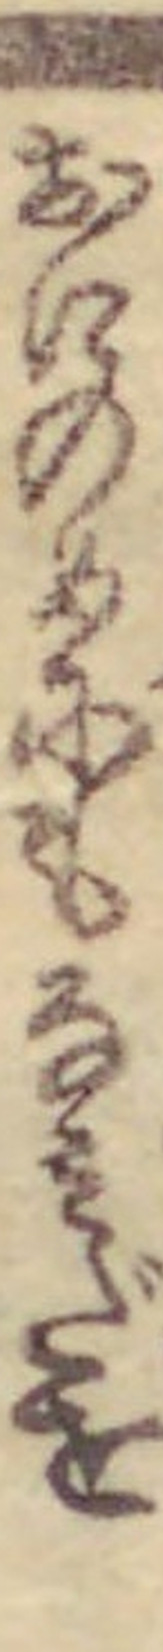おにのめにもなみだを
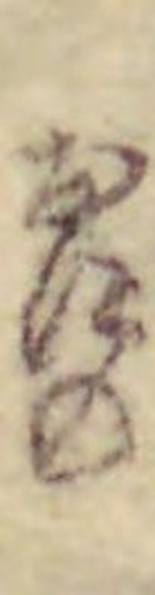おにの
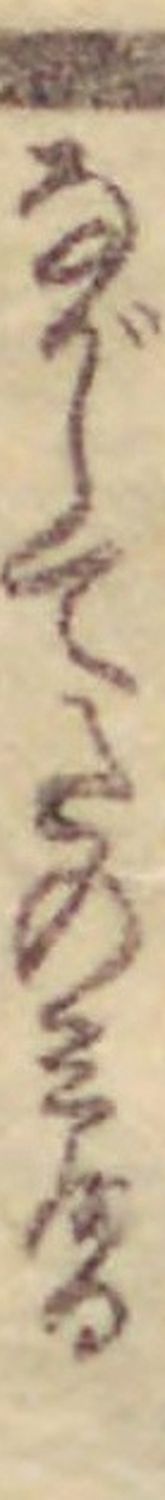ながしてたのみける
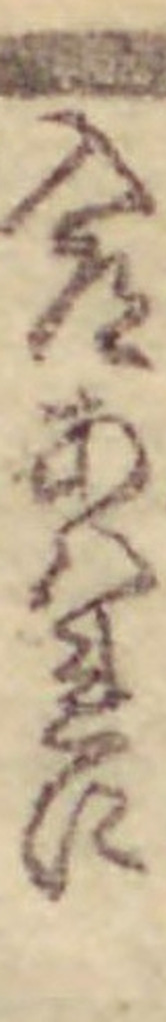入道あはれに
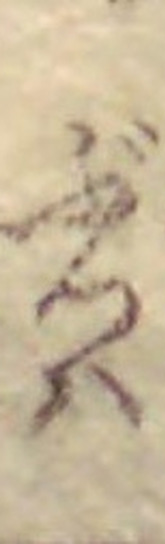ぶつは
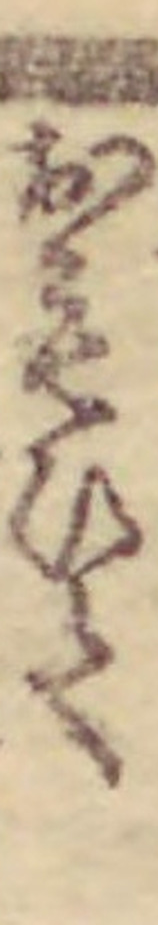おもひて
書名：化物世帯氣質
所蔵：国立国会図書館 National Diet Library, JAPAN
